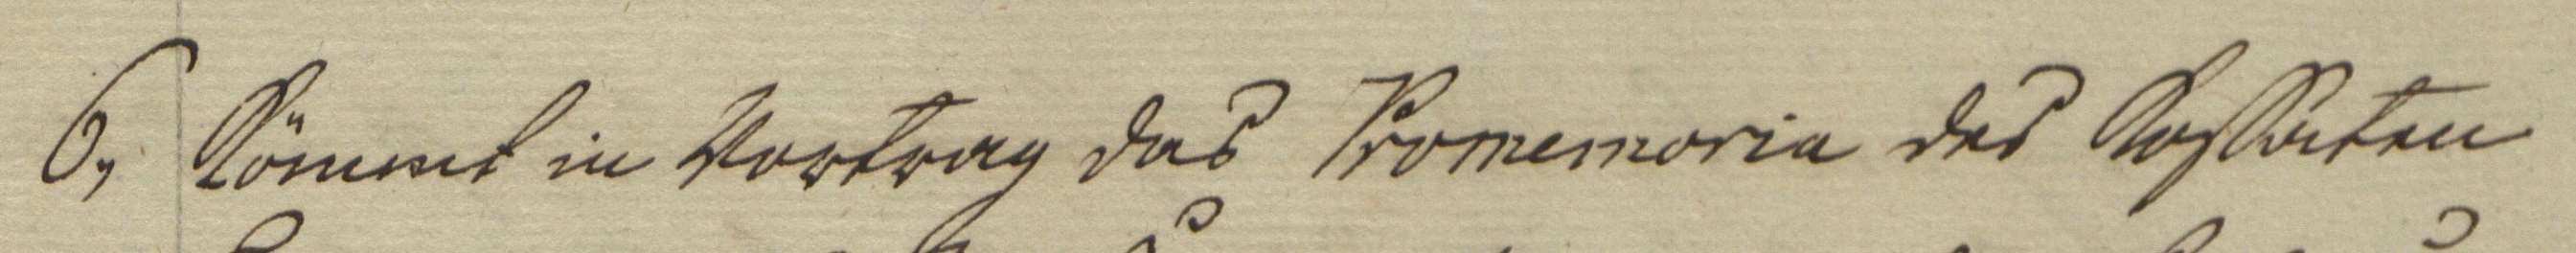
6., Kömmt in Vortrag das Promemoria des Kossaten
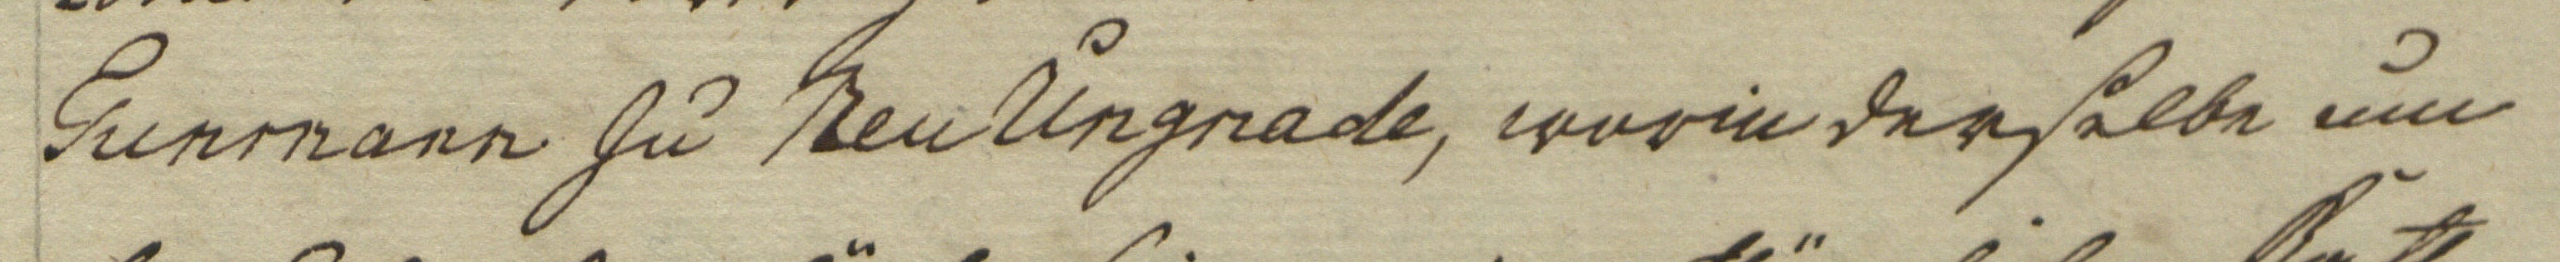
Tunmann zu NeuUngnade, worin derselbe um
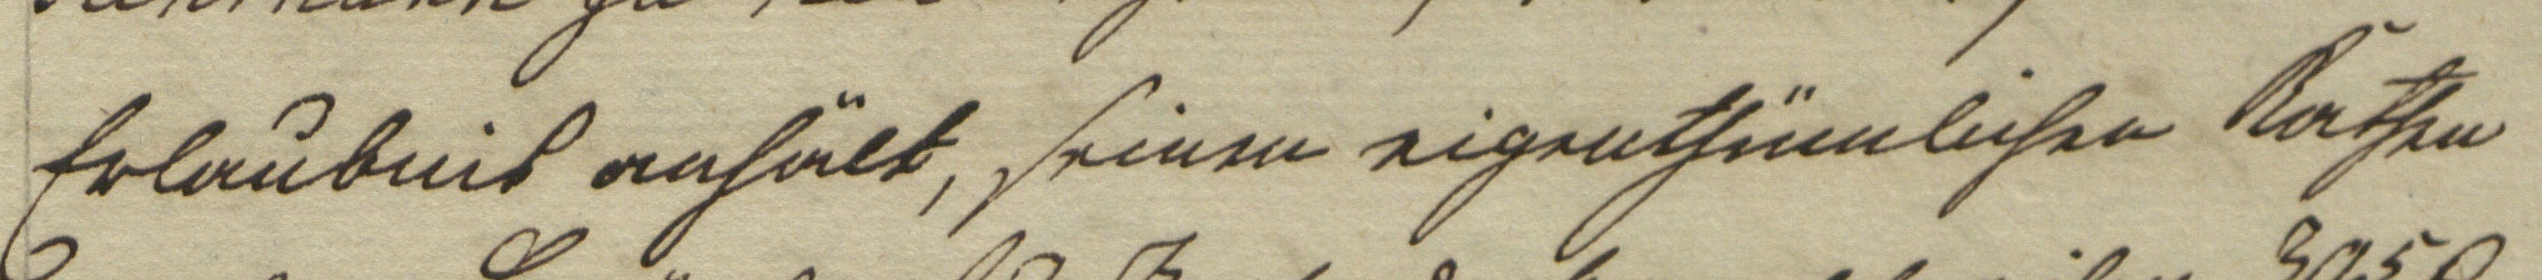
Erlaubnis anhält, seinen eigenthümlichen Kathen
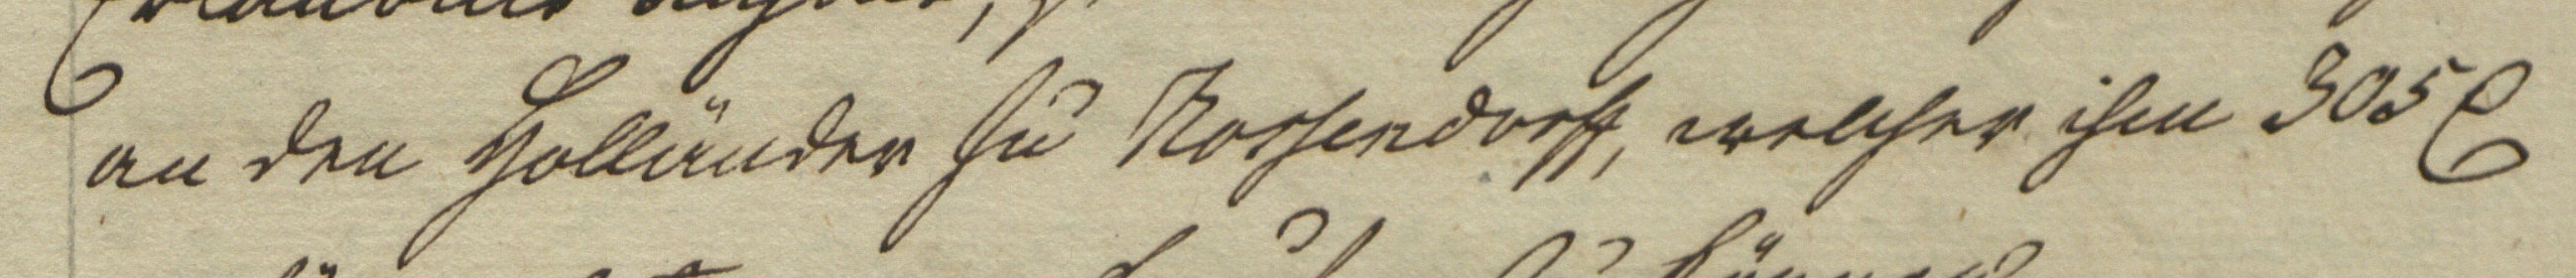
an den Holländer zu Nossendorff, welcher ihm 305 l
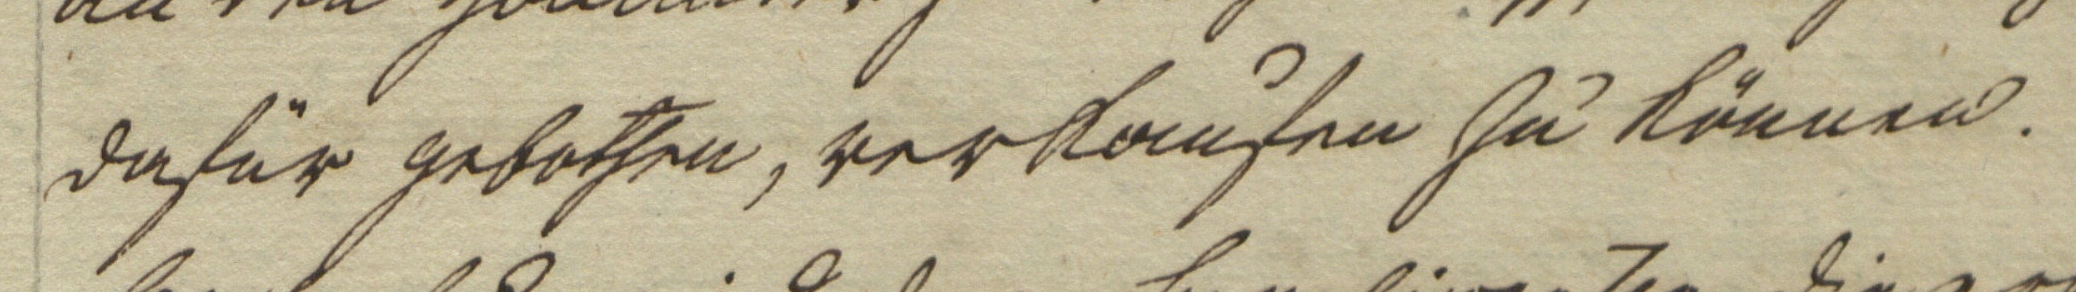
dafür gebothen, verkaufen zu können.
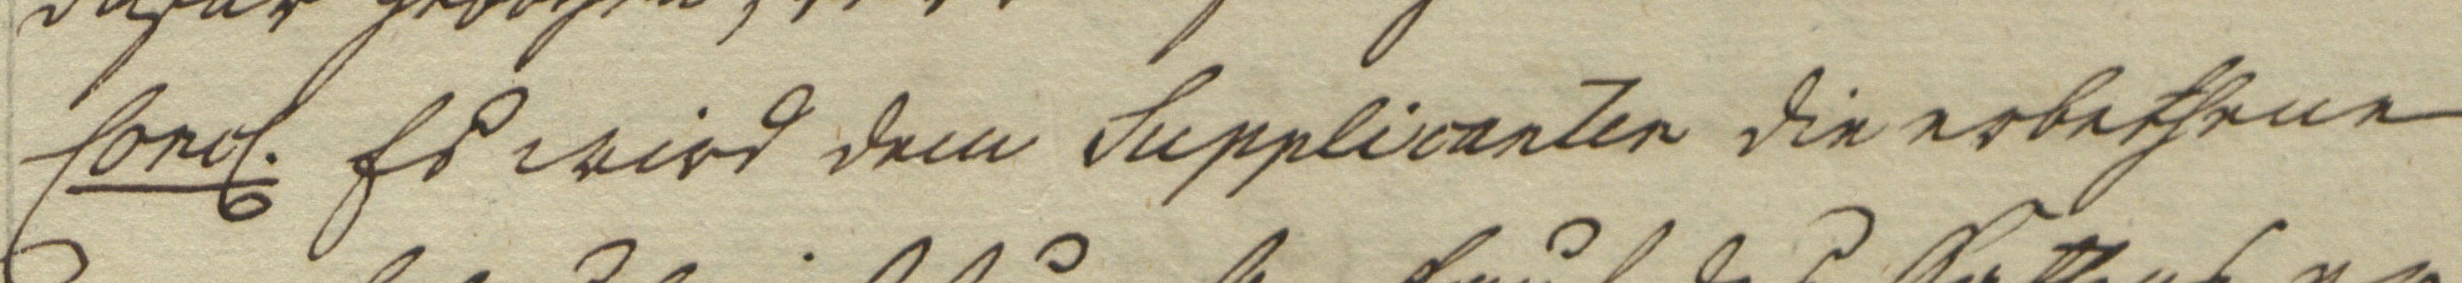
Concl. Es wird dem Supplicanten die erbethene
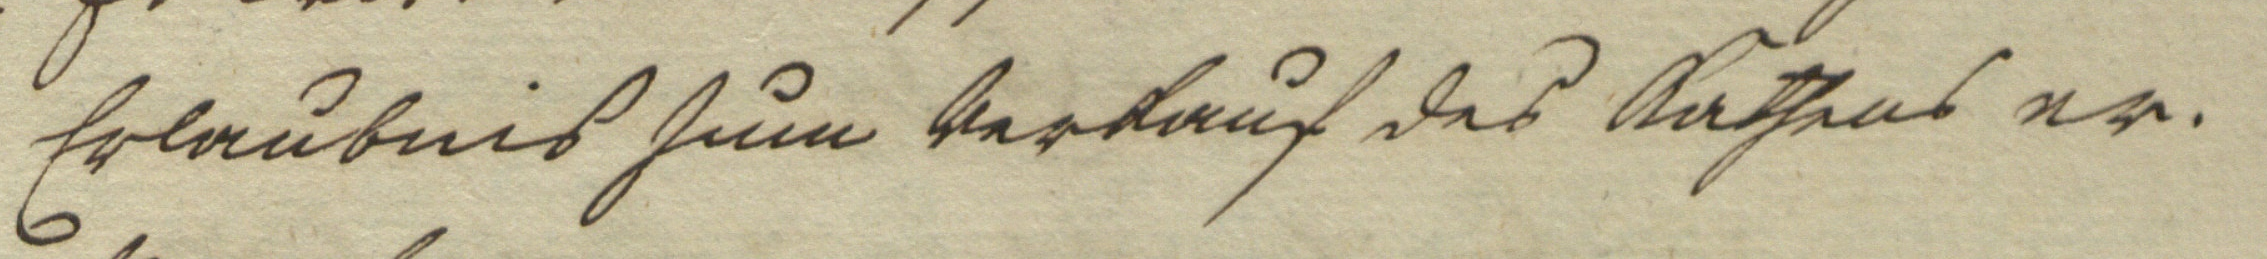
Erlaubnis zum Verkauf des Kathens er¬
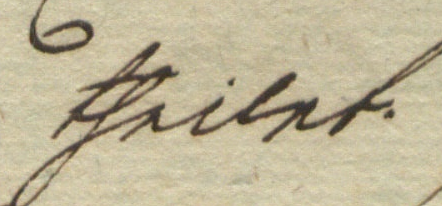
theilet.
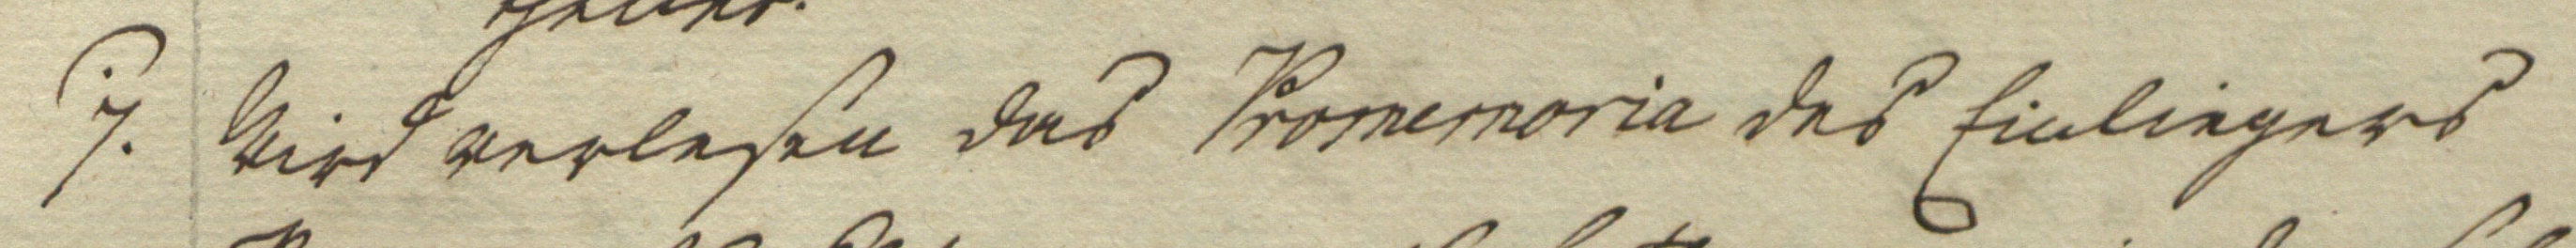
7. Wird verlesen das Promemoria des Einliegers
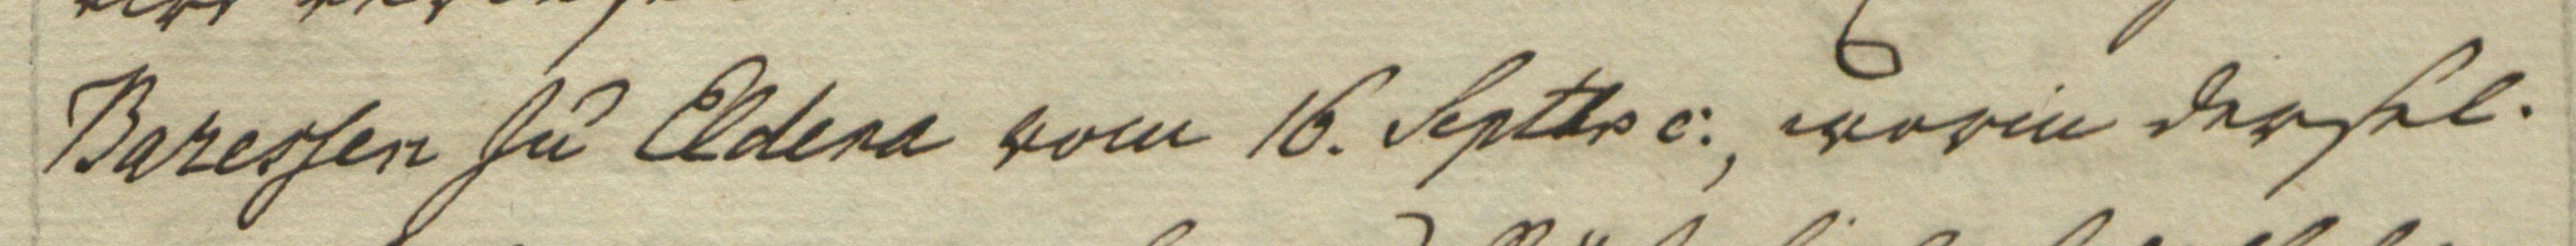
Baressen zu Eldena vom 16. Septbr c., worin dersel¬
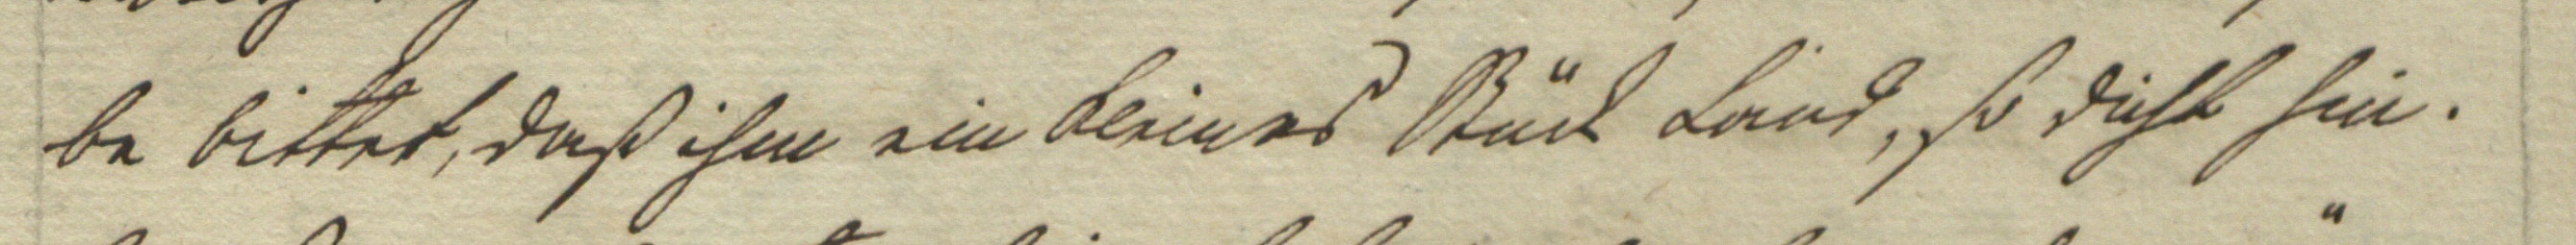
be bittet, daß ihm ein kleines Stück Land, so dicht hin¬
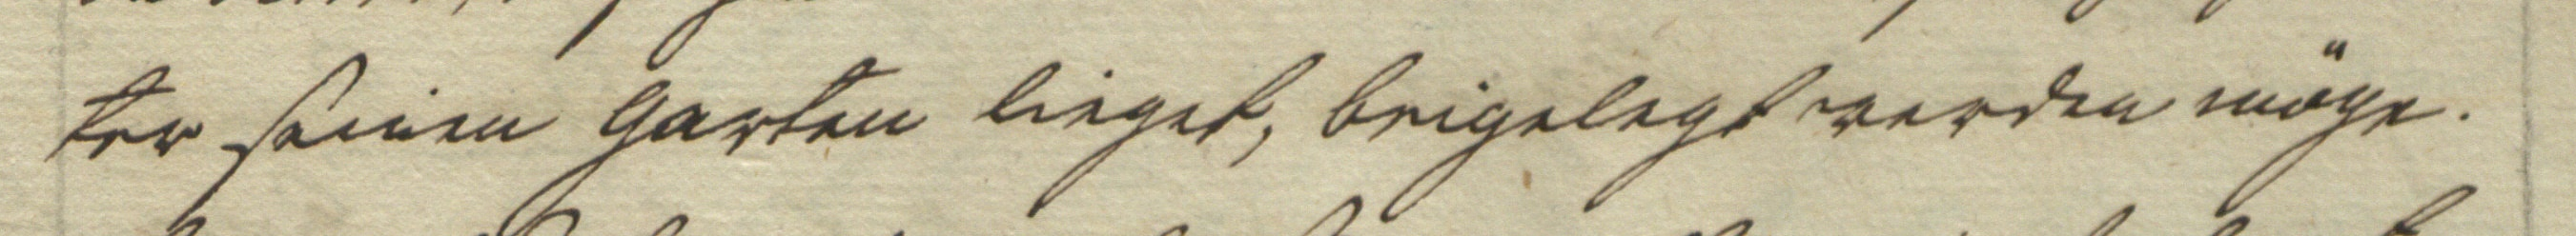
ter seinem Garten lieget, beigelegt werden möge.
